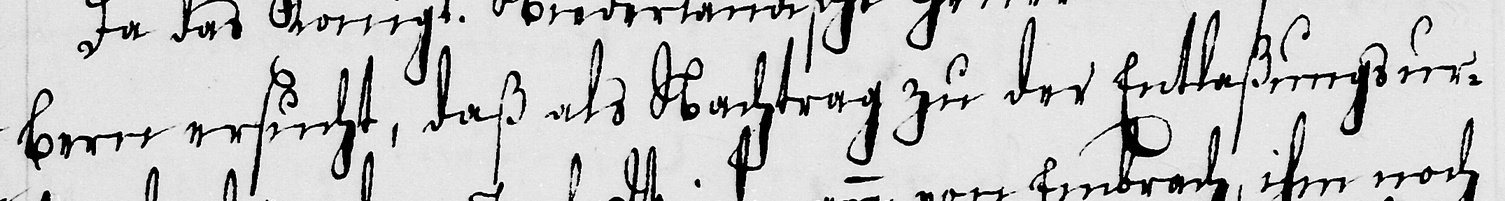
Bern ersucht, daß als Nachtrag zu der Entlaßungsur¬
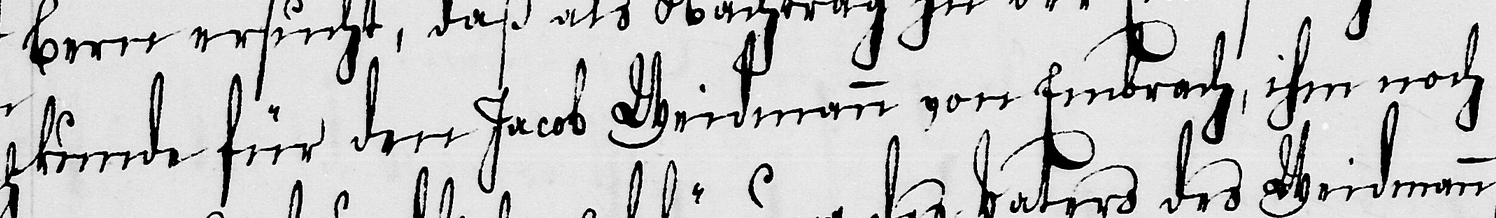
kunde für den Jacob Weidmann von Embrach, ihm noch
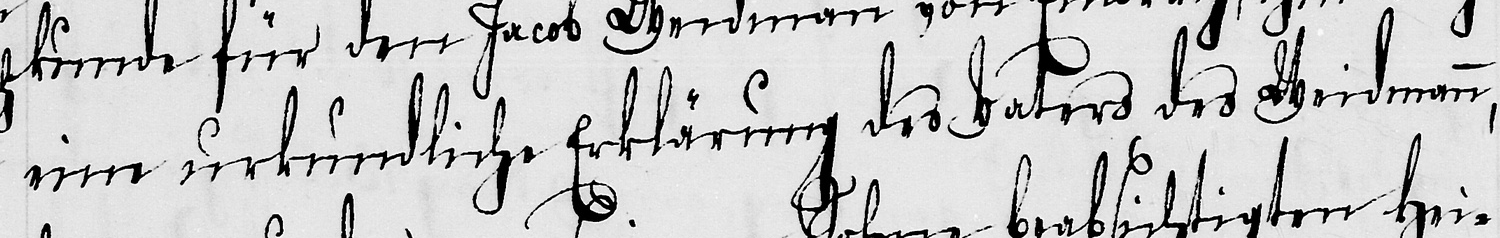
eine urkundliche Erklärung des Vaters des Weidman¬
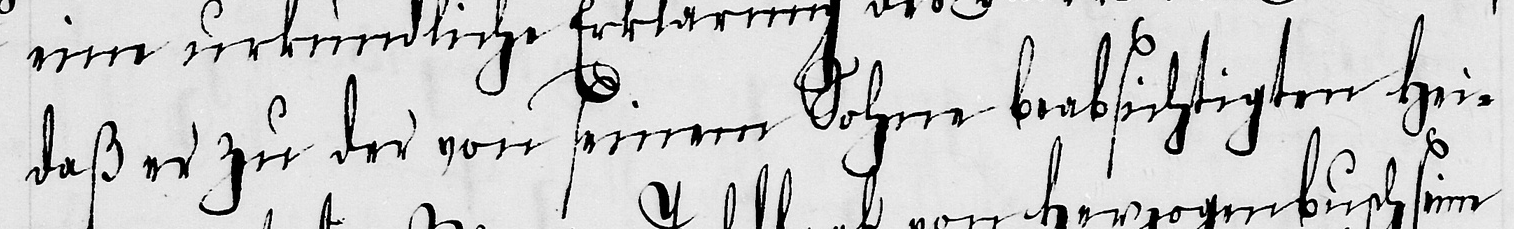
daß er zu der von seinem Sohne beabsichtigten Hei¬
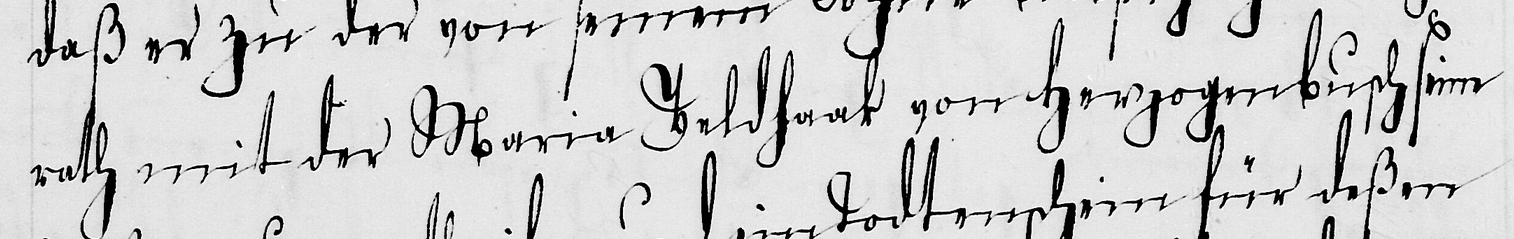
rath mit der Maria Veldhaak von Herzogenbusch seine
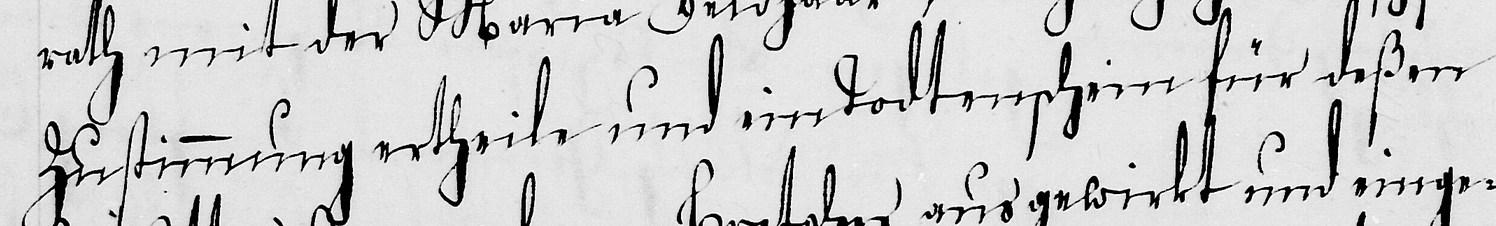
Zustimmung ertheile und ein Todtenschein für deßen
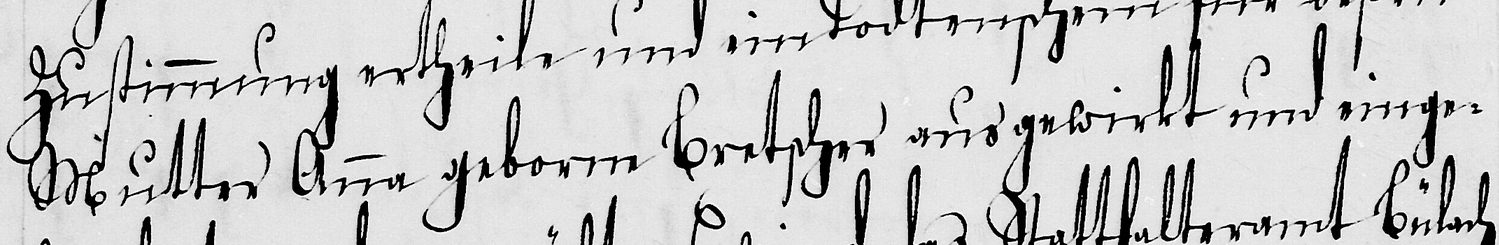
Mutter Anna geborne Bretscher ausgewirkt und einge¬
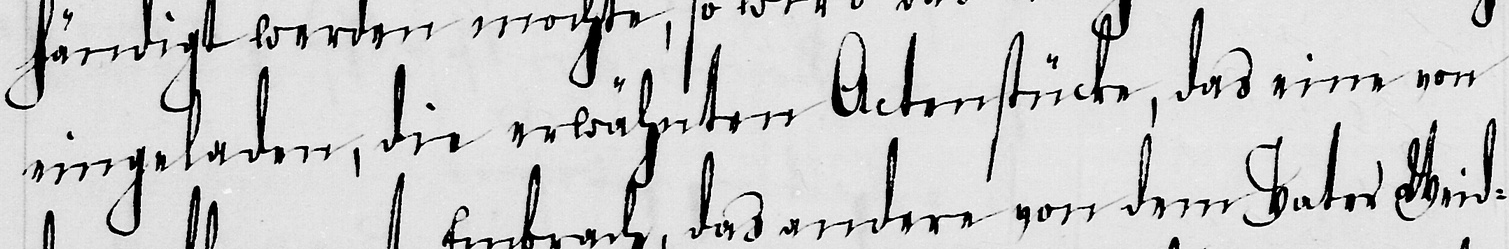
eingeladen, die erwähnten Actenstücke, das eine von
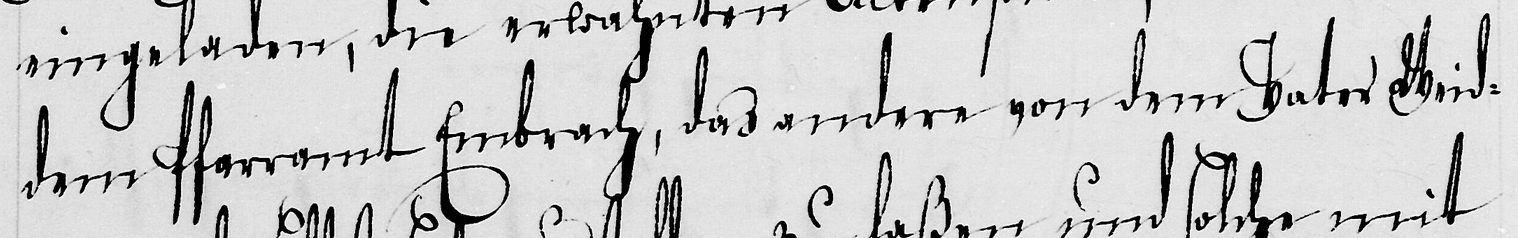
dem Pfarramt Embrach, das andere von dem Vater Weid¬
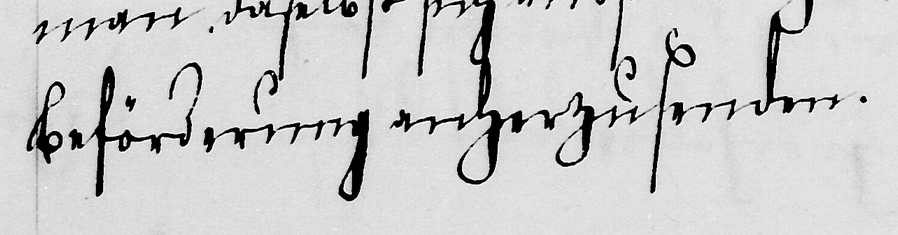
Beförderung anherzusenden.
